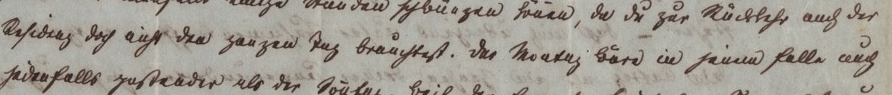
Residenz doch nicht den ganzen Tag brauchtest. Der Montag wäre in jenem Falle auch
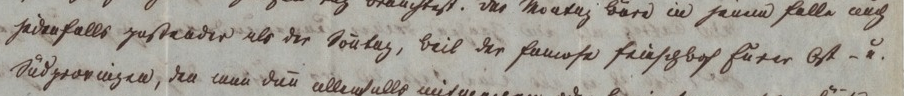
jedenfalls passender als der Sonntag, weil der famose Feinschwof Eurer Ost- u.
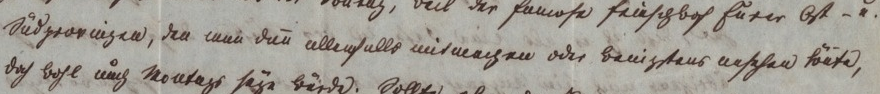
Südprovinzen, den man dann allenfalls mitmachen oder wenigstens ansehen könnte,
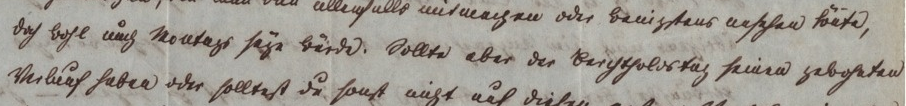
doch wohl auch Montag seyn würde. Sollte aber der Berchtholdstag seinen gewohnten
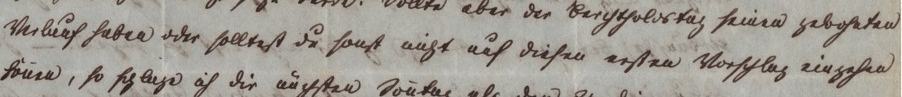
Verlauf haben oder solltest du sonst nicht auf diesen ersten Vorschlag eingehen
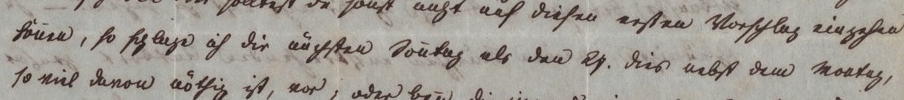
können, so schlage ich dir nächsten Sonntag als den 27. dies nebst dem Montag,
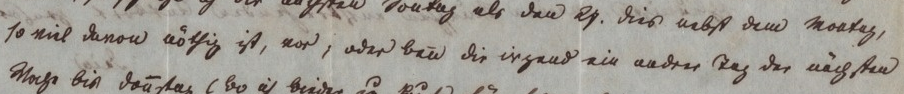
so viel davon nötig ist, vor, oder wenn dir irgend ein andrer Tag der nächsten
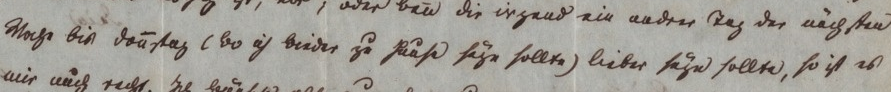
Woche bis Donnstag (wo ich wieder zu Hause seyn sollte) lieber seyn sollte, so ist es
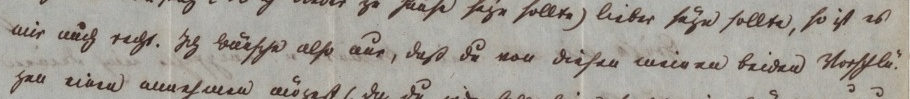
mir auch recht. Ich wünsche also nur, daß du von diesen meinen beiden Vorschlä-
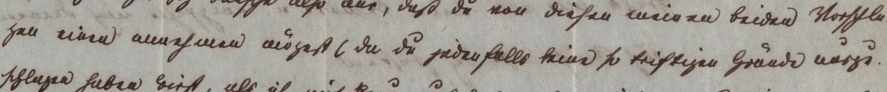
gen einen annehmen mögest (da du jedenfalls keine so triftigen Gründe auszu-
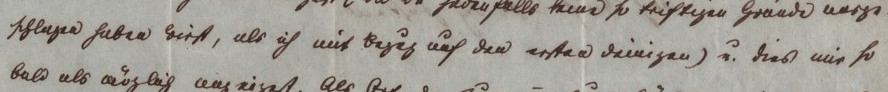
schlagen haben wirst, als ich mit Bezug auf den ersten deinigen) u. dies mir so
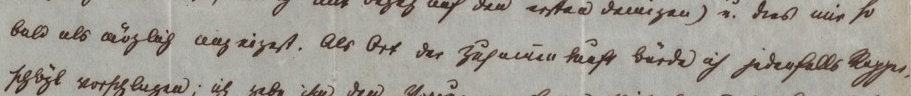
bald als möglich anzeigest. Als Ort der Zusammenkunft würde ich jedenfalls Rapper-
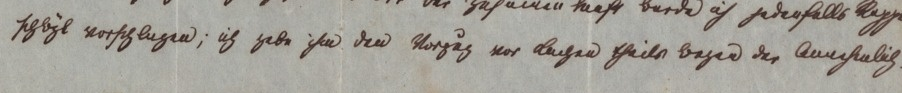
schwyl vorschlagen; ich gebe ihm den Vorzug vor Lachen theils wegen der Annehmlich-
